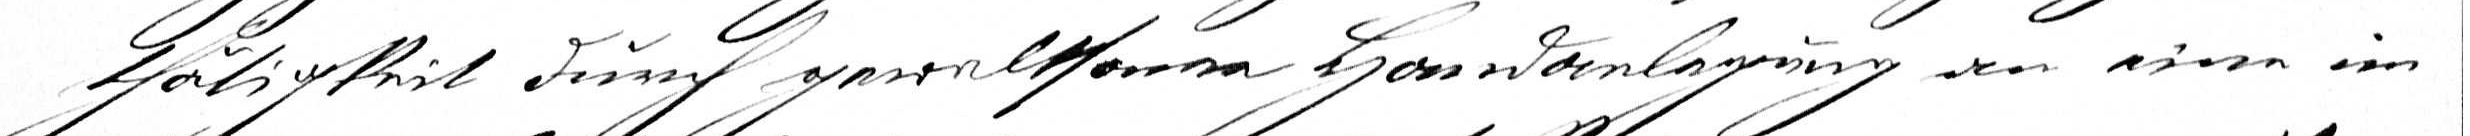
thätigkeit durch gewaltsxx Handanlegung an eine im
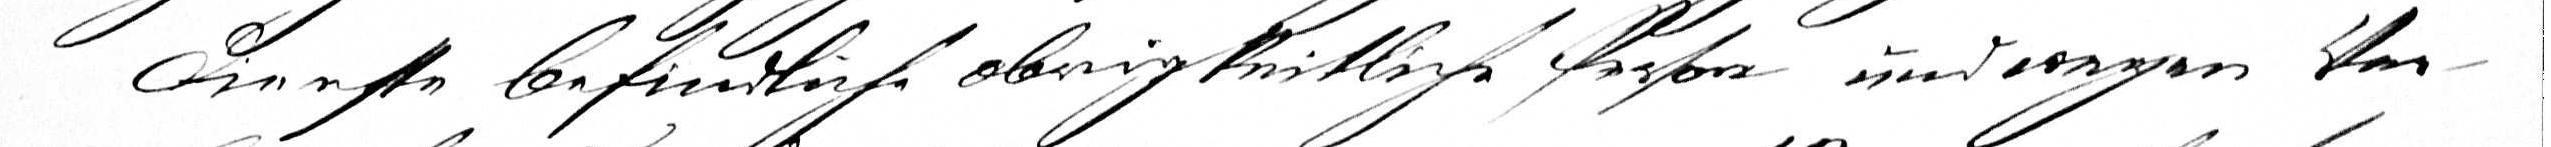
Dienste befindliche obrigkeitliche Person und wegen Ver¬
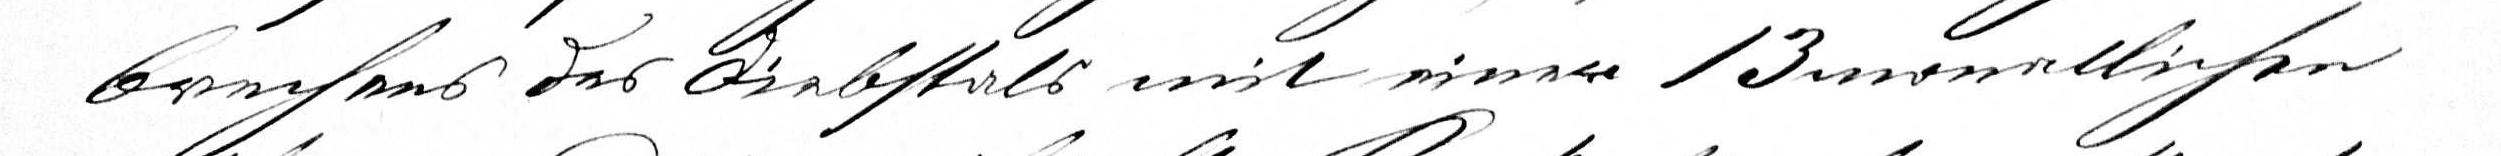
brechens des Diebstals mit einer 13 monatlichen
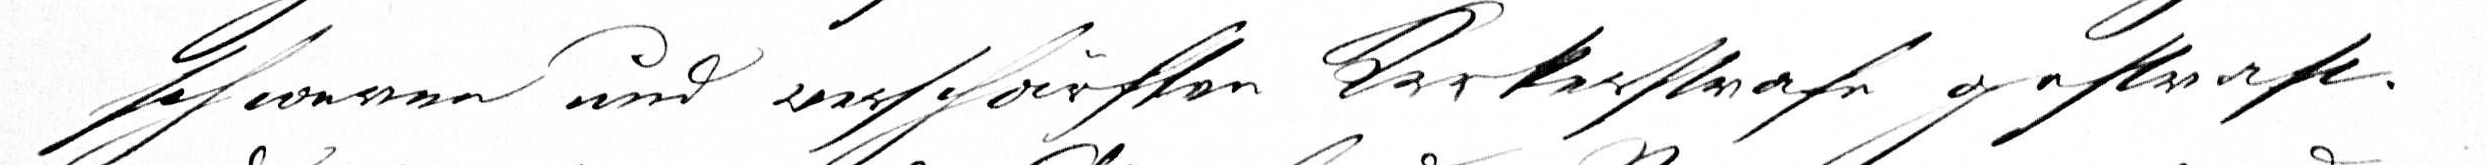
schweren und verschärften Kerkerstrafe gestraft.
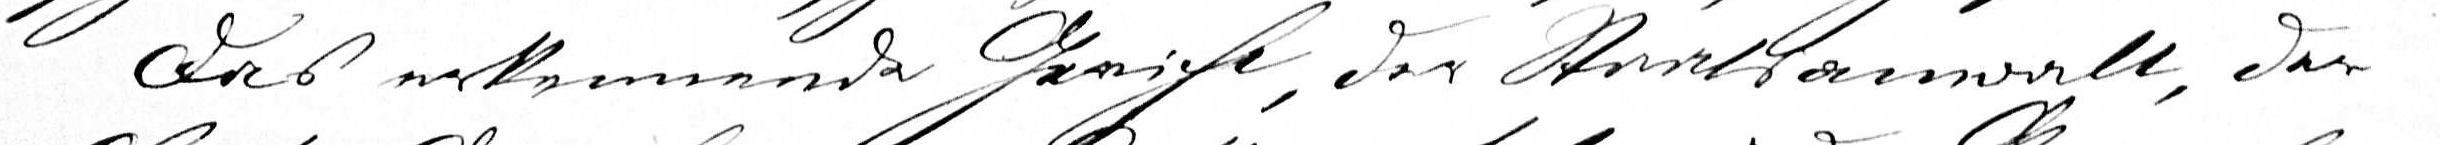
Das erkennende Gericht, der Staatsanwalt, der
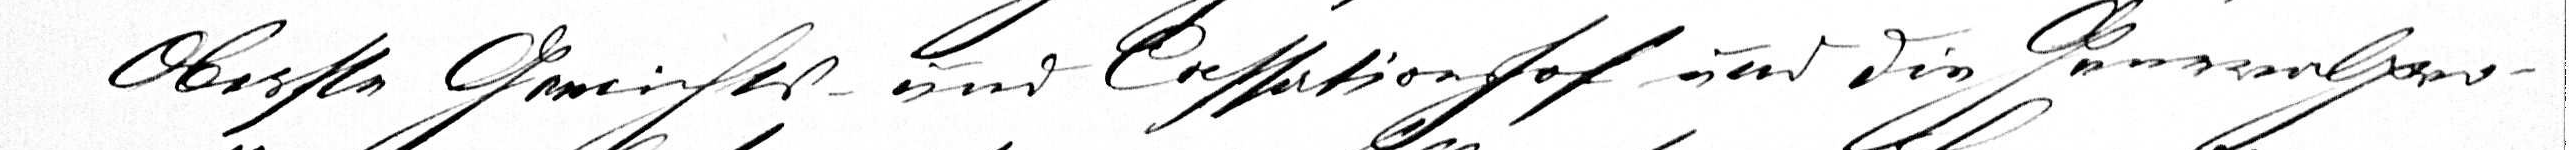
Oberste Gerichts- und Cassationshof und die Generalpro¬
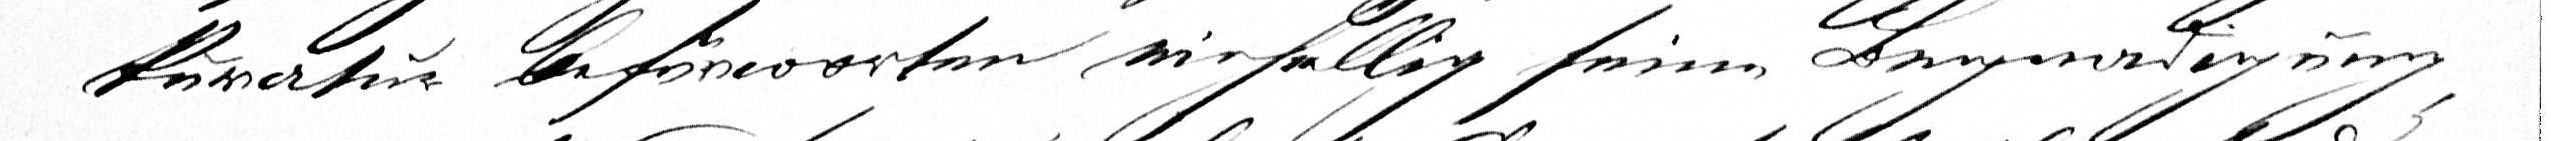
kuratur befürworten einhellig seine Begnadigung,
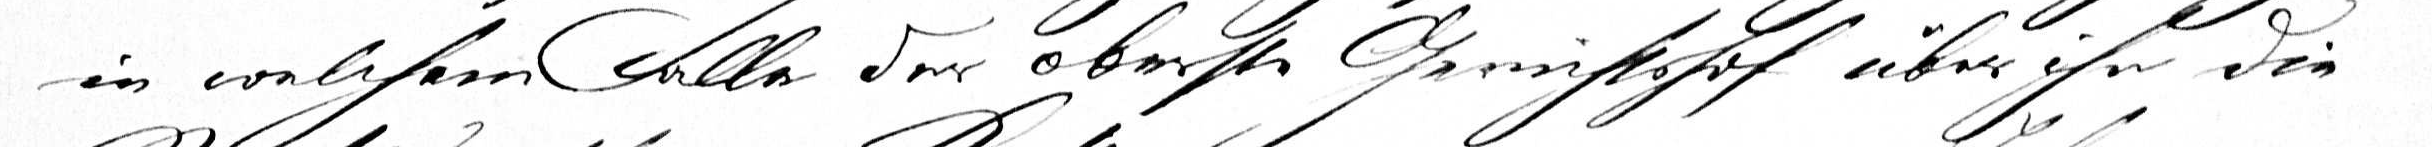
in welchem Falle der oberste Gerichtshof über ihn die
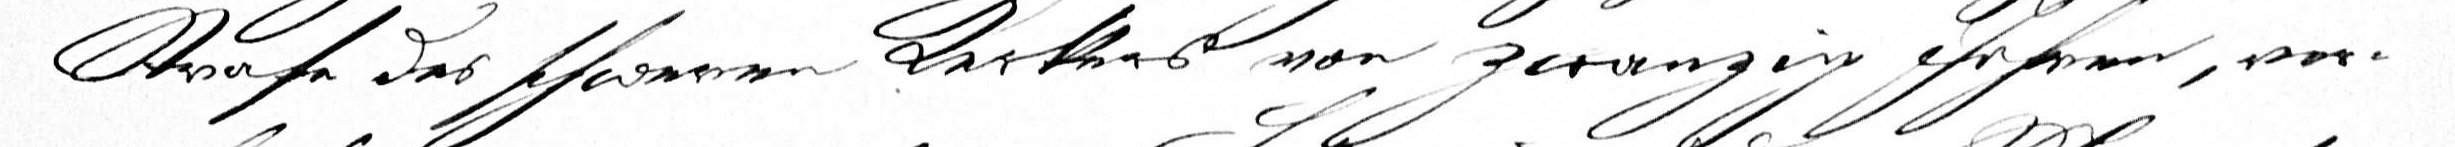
Strafe des schweren Kerkers von zwanzig Jahren, vor¬
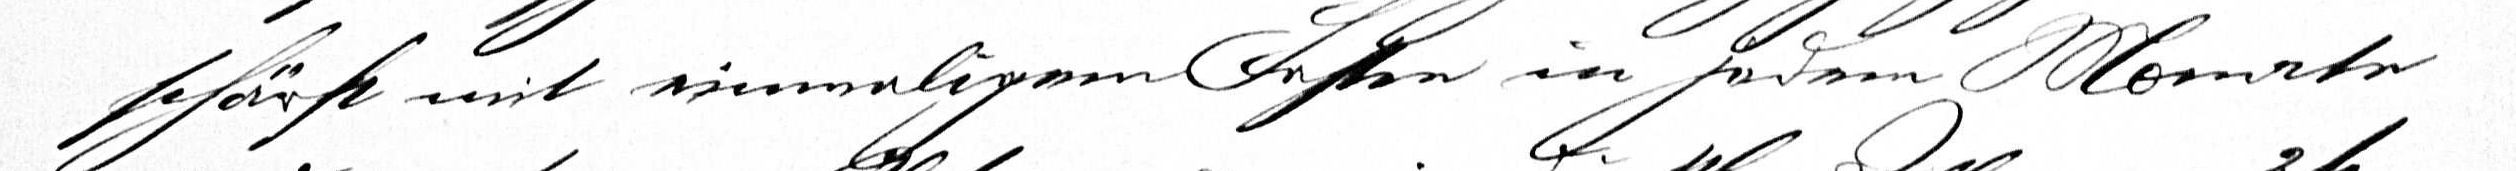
schärft mit einmaligem Fasten in jedem Monate
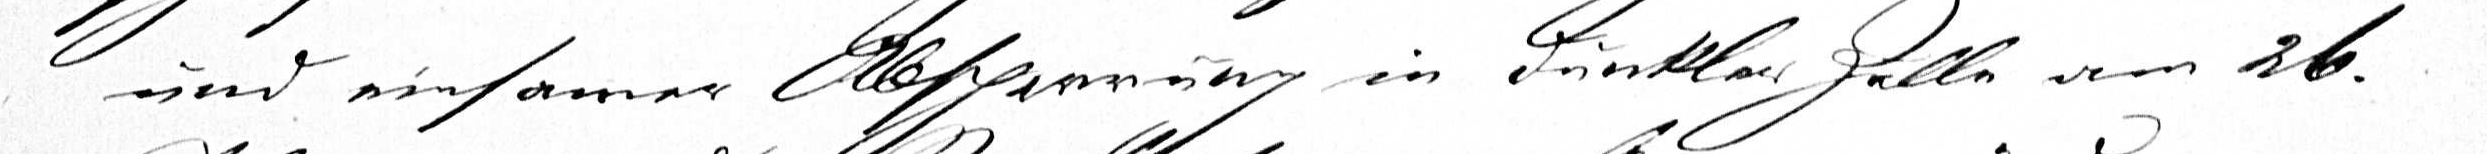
und einsamer Absperrung in dunkler Zelle am 26.
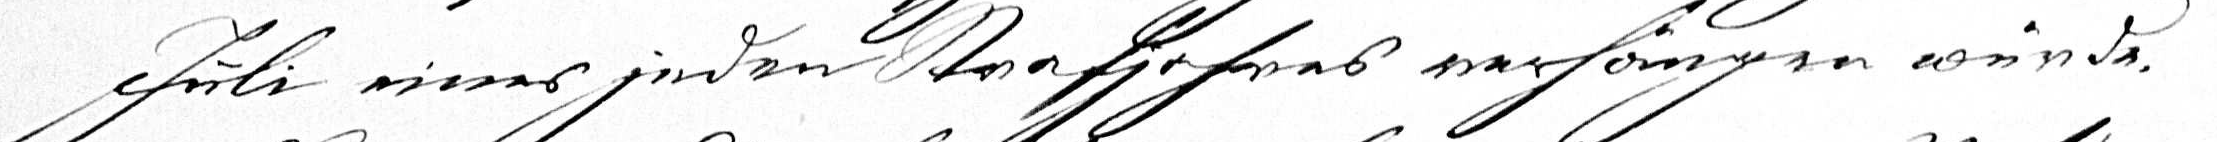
Juli eines jeden Strafjahres verhängen würde.
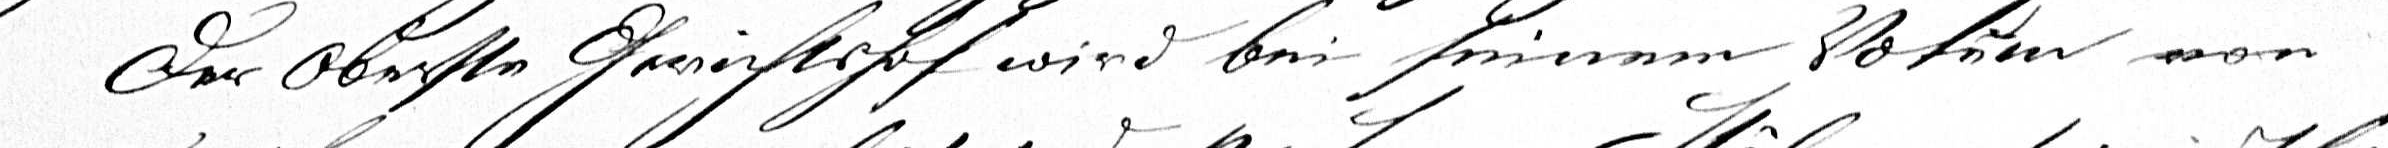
Der Oberste Gerichtshof wird bei seinem Votum von
